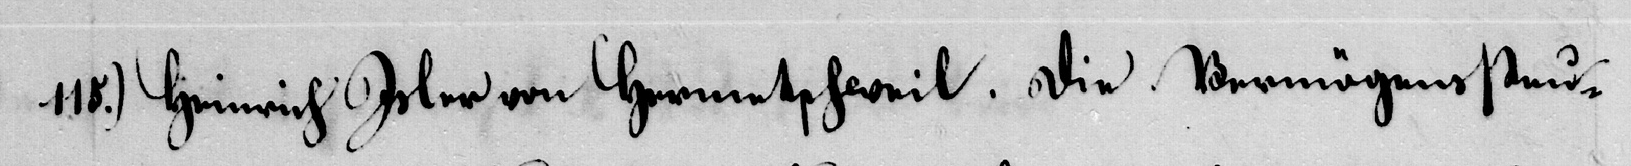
115.) Heinrich Isler von Hermetschweil. Die Vermögenssteu¬
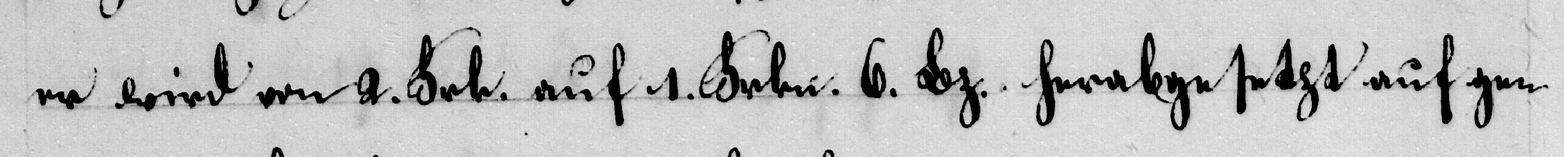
er wird von 2. Frk. auf 1. Frkn. 6. Bz. herabgesetzt auf ge¬
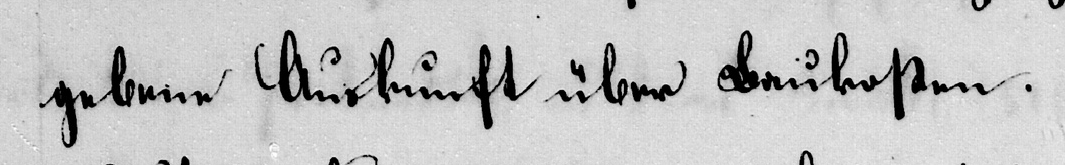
gebene Auskunft über Baukosten.
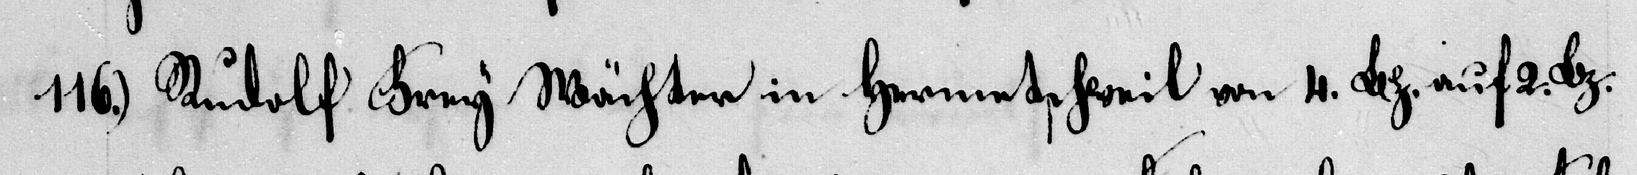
116.) Rudolf Frey Wächter in Hermetschweil von 4. Bz. auf 2. Bz.
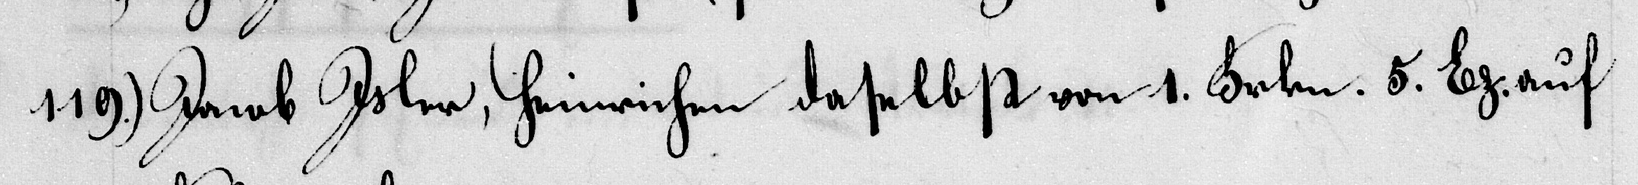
119.) Jacob Isler, heinrichen daselbst von 1. Frkn. 5. Bz. auf
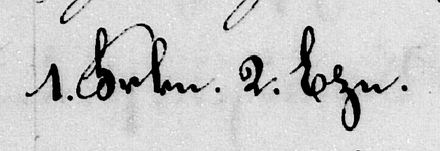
1. Frk. 2. Bzn.
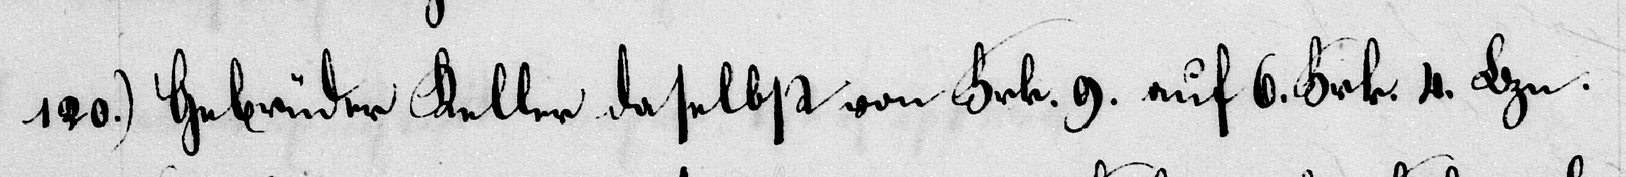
120.) Gebrüder Keller daselbst von Frk. 9. auf 6. Frk. 4. Bzn.
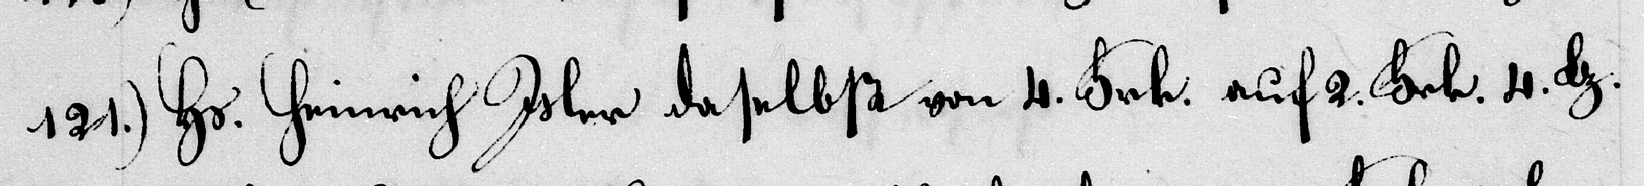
121.) Hs. Heinrich Isler daselbst von 4. Frk. auf 2. Frk. 4. Bz.
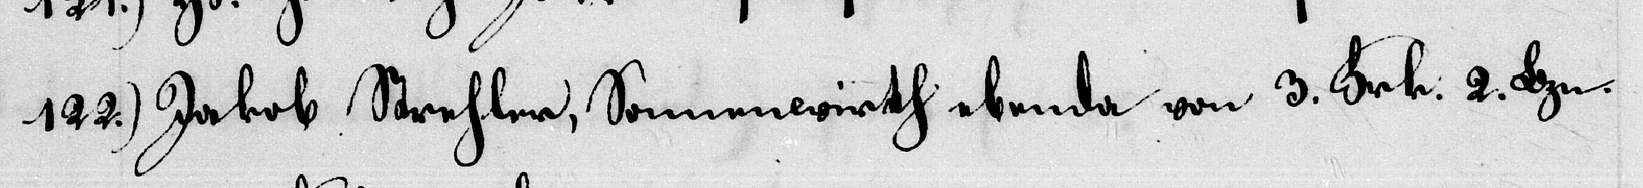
122.) Jacob Strehler, Sonnenwirth ebenda von 3. Frk. 2. Bz.
